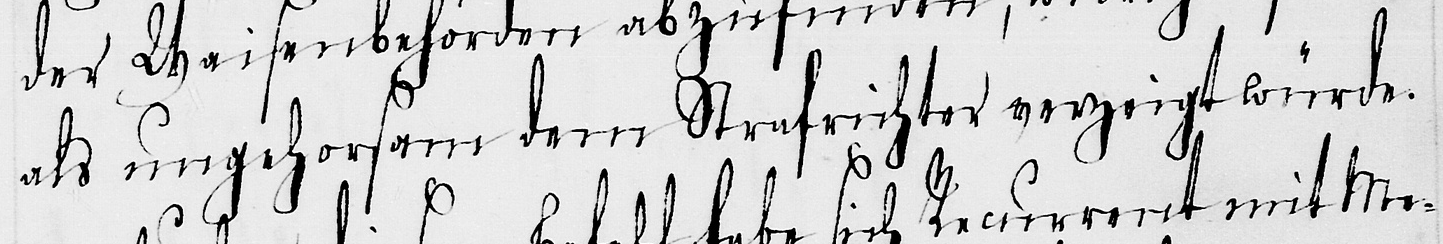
als ungehorsam dem Strafrichter verzeigt würde.
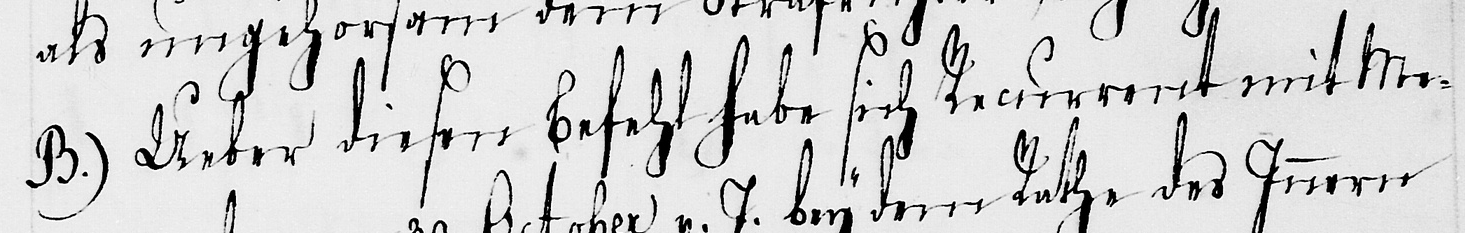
B.) Ueber diesen Befehl habe sich Recurrent mit Me¬
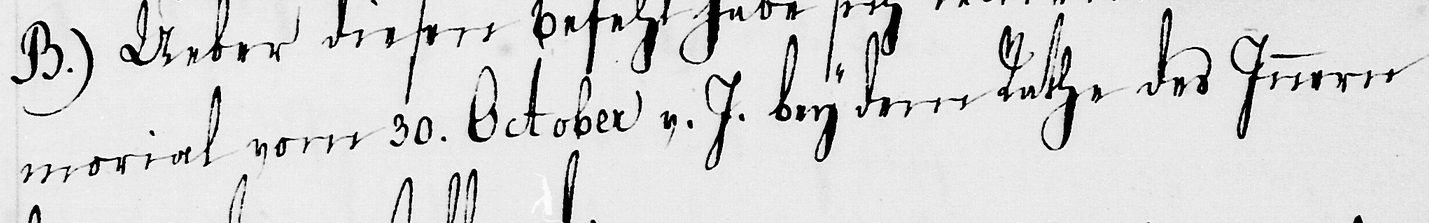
morial vom 30. October v. J. bey dem Rathe des Innern
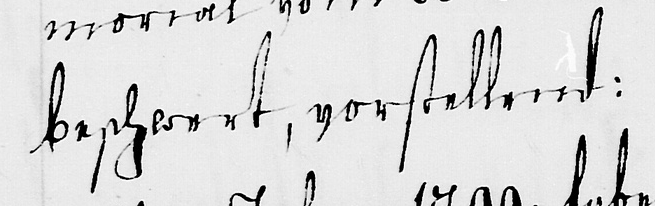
beschwert, vorstellend:
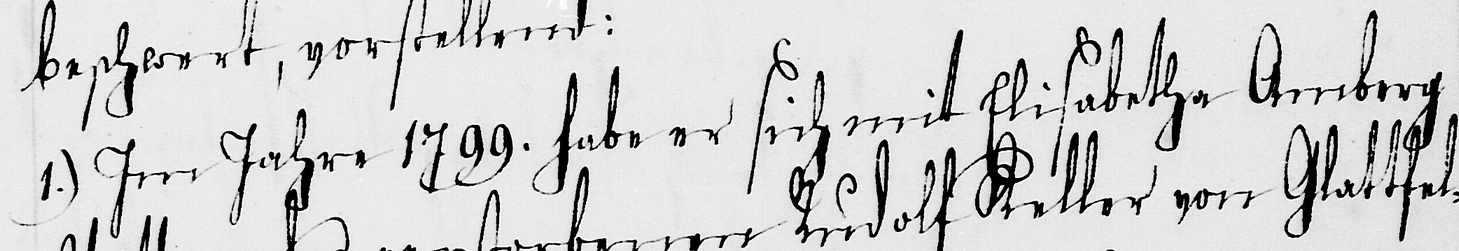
1.) Im Jahre 1799. habe er sich mit Elisabetha Amberg
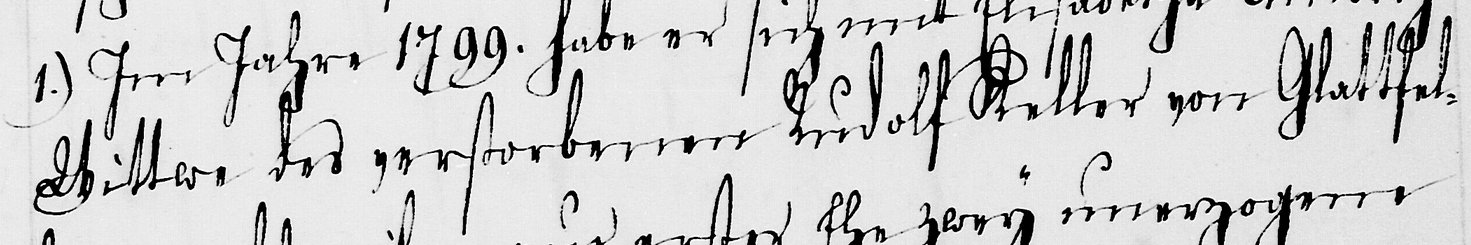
Wittwe des verstorbenen Rudolf Keller von Glattfe¬
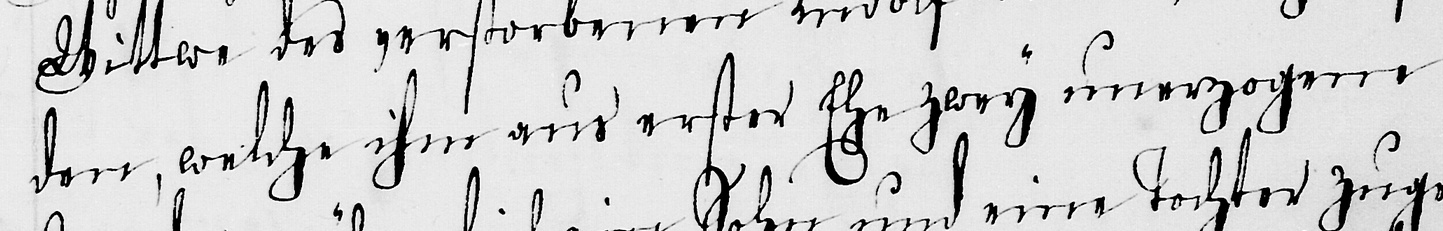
lden, welche ihm aus erster Ehe zwey unerzogene
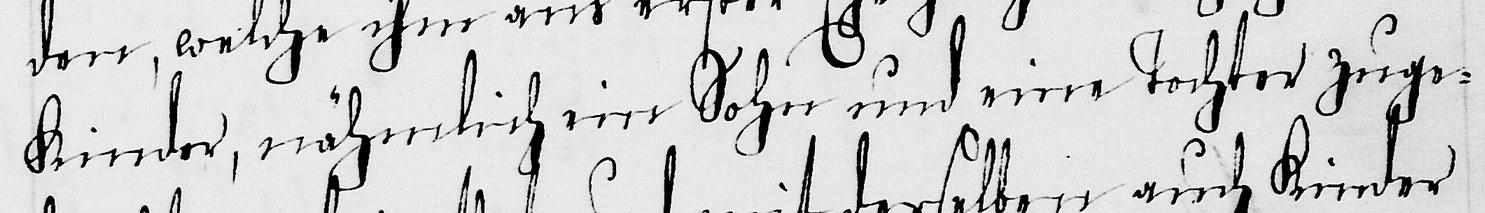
Kinder, nähmlich ein Sohn und eine Tochter zuge¬
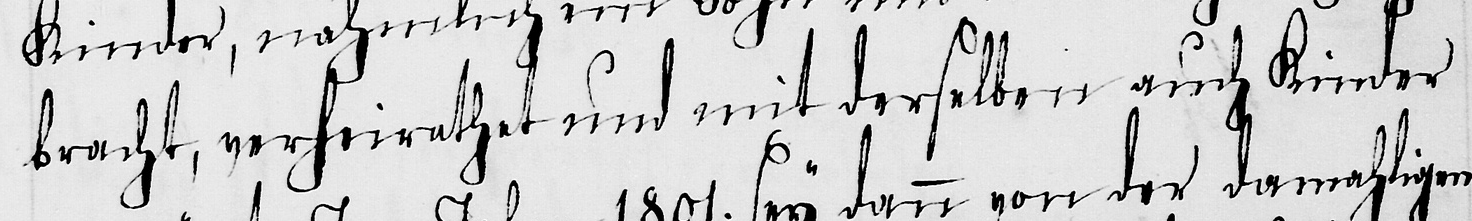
bracht, verheirathet und mit derselben auch Kinder
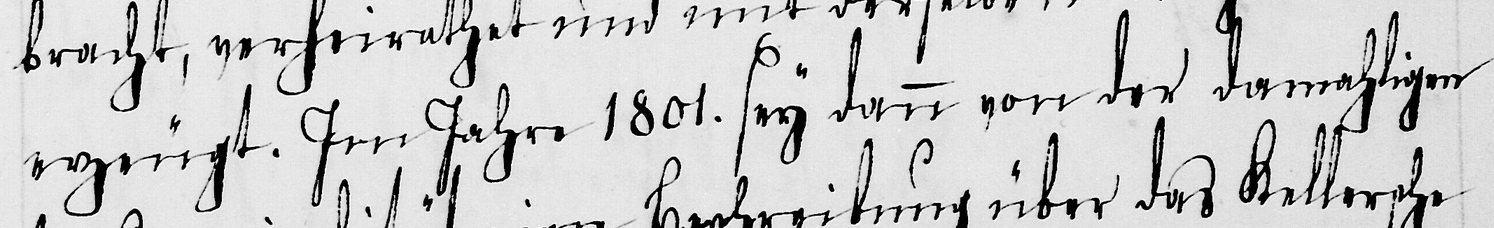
erzeugt. Im Jahre 1801. sey dann von der damahligen
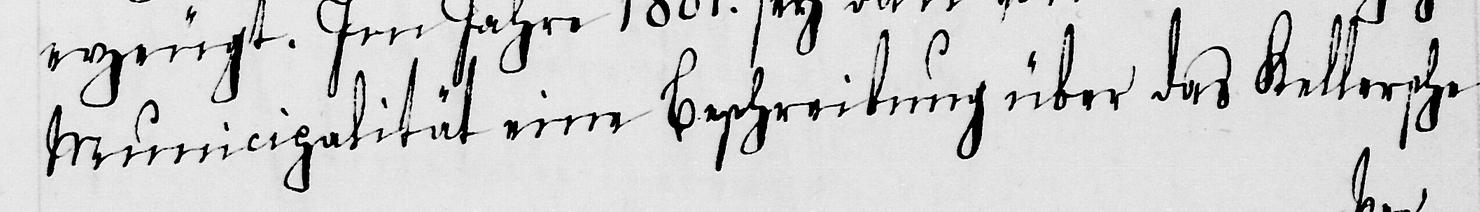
Municipalität eine Beschreibung über das Kellersche
